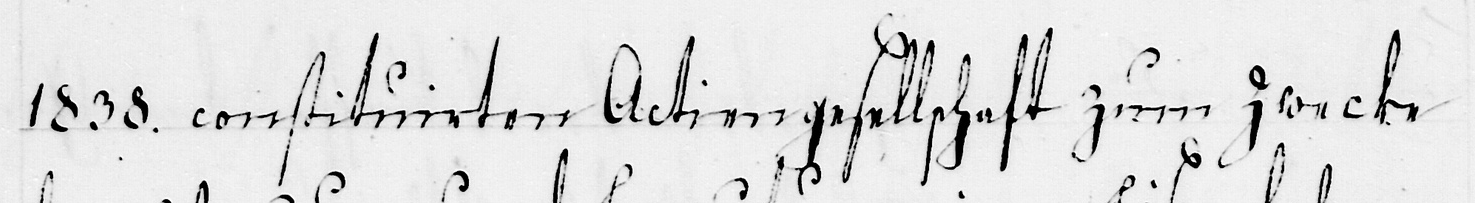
1838. constituirten Actiengesellschaft zum Zwecke
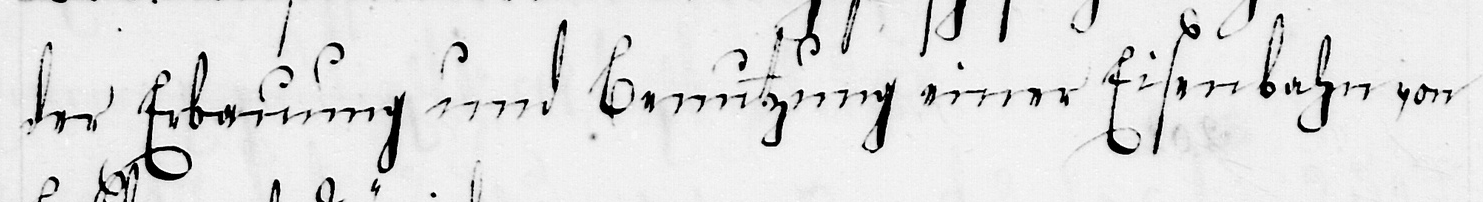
der Erbauung und Benutzung einer Eisenbahn von
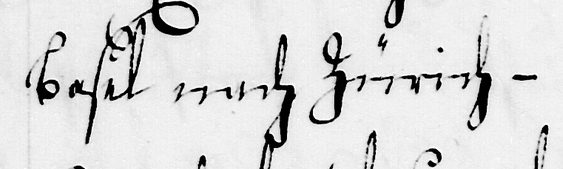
Basel nach Zürich –
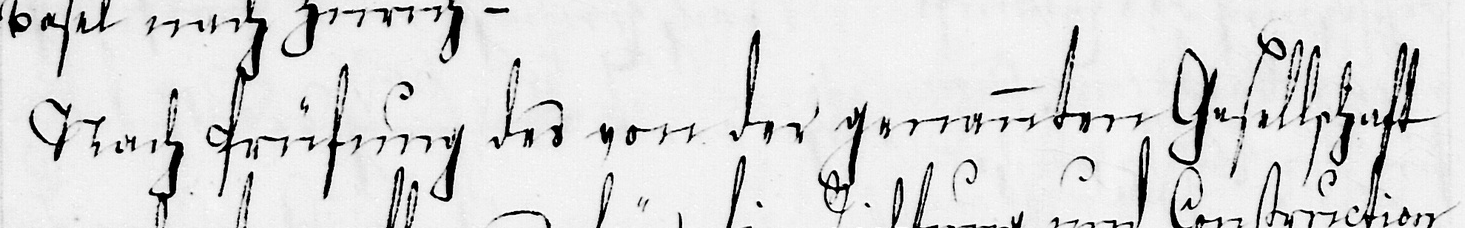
Nach Prüfung des von der genannten Gesellscha¬
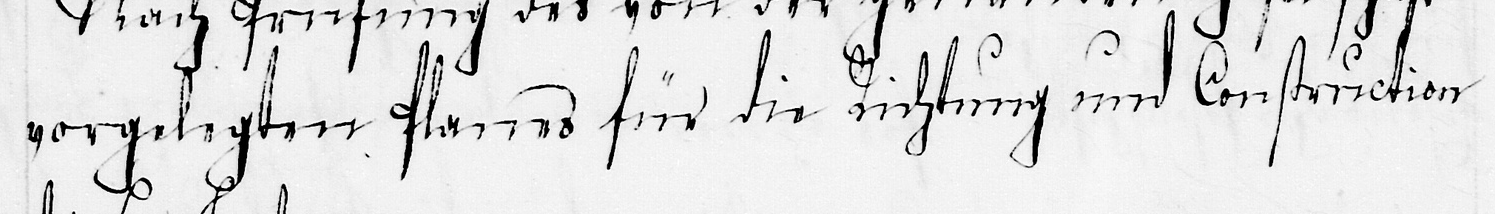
vorgelegten Planes für die Richtung und Construction
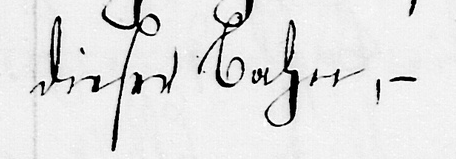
dieser Bahn, –
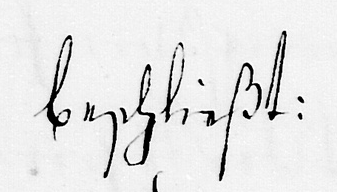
beschließt:
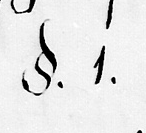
§. 1.
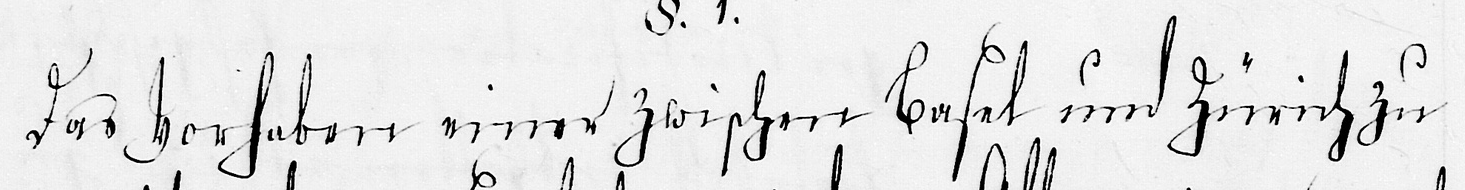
Das Vorhaben einer zwischen Basel und Zürich zu
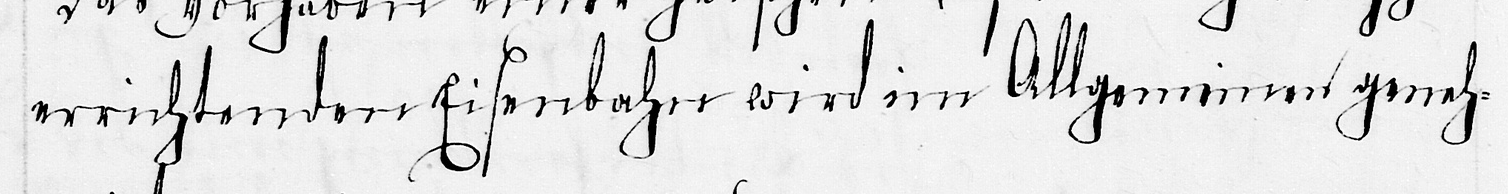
errichtenden Eisenbahn wird im Allgemeinen geneh¬
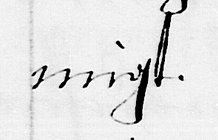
migt.
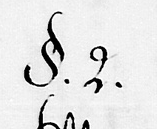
§. 2.
